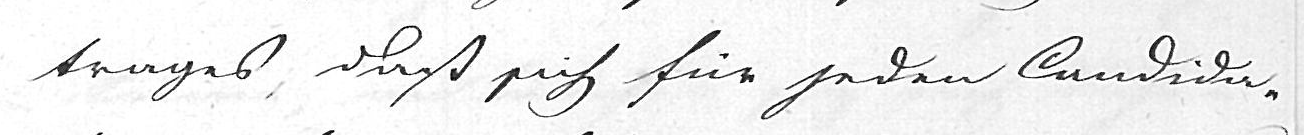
trages, daß sich für jeden Candida-
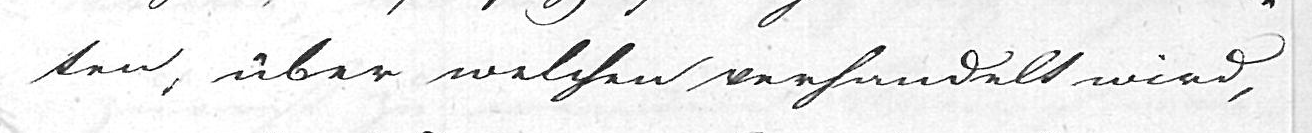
ten, über welchen verhandelt wird,
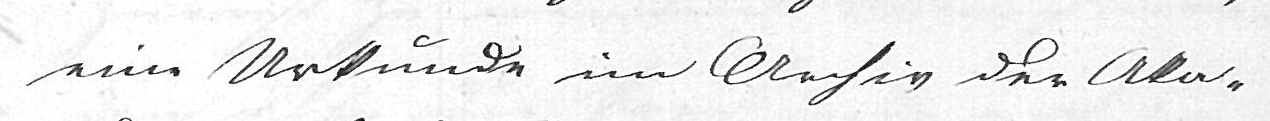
eine Urkunde im Archiv der Aka-
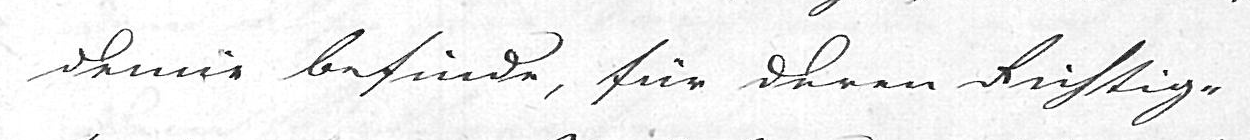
demie befinde, für deren Richtig-
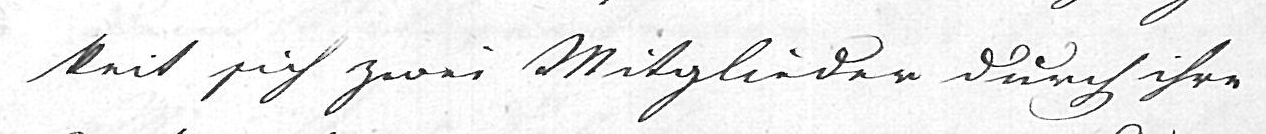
keit sich zwei Mitglieder durch ihre
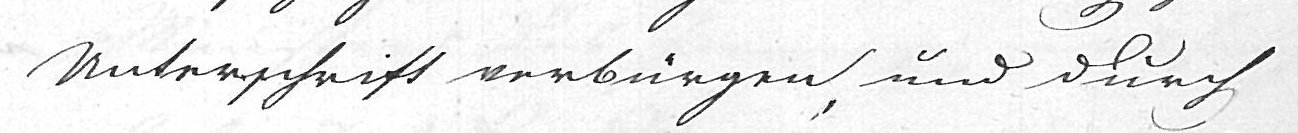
Unterschrift verbürgen und durch
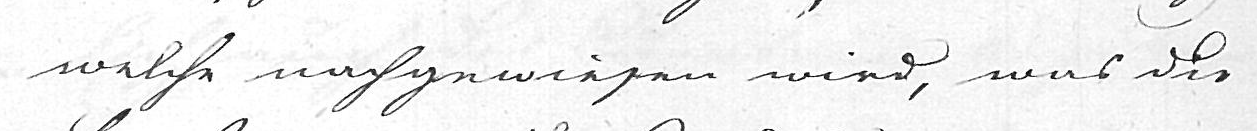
welche nachgewiesen wird, was die
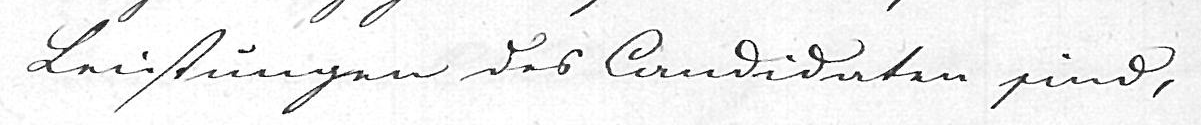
Leistungen des Candidaten sind,
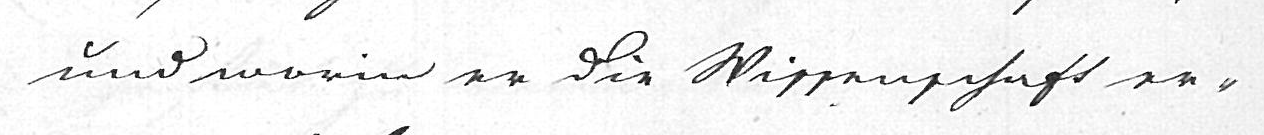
und worin er die Wissenschaft er-
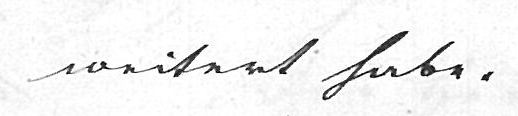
weitert habe.
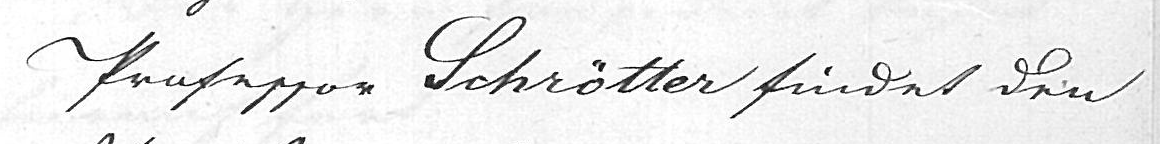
Professor Schrötter findet den
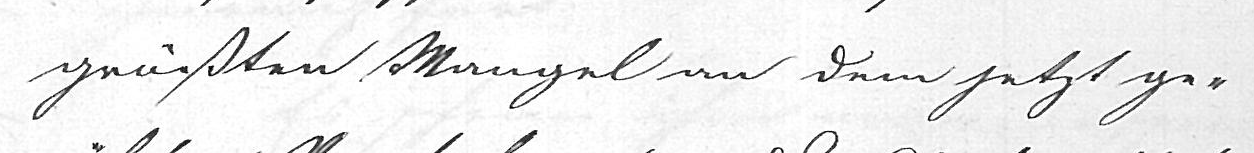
größten Mangel an dem jetzt ge-
